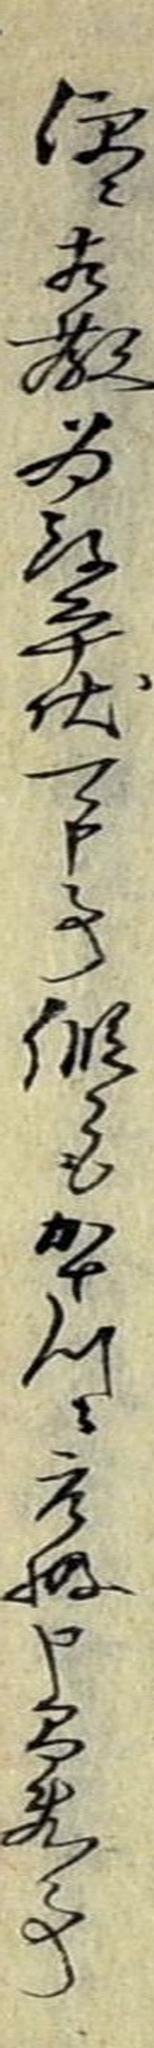便に相敬為致平伏可申事仮にもかさつ之取扱申間敷事
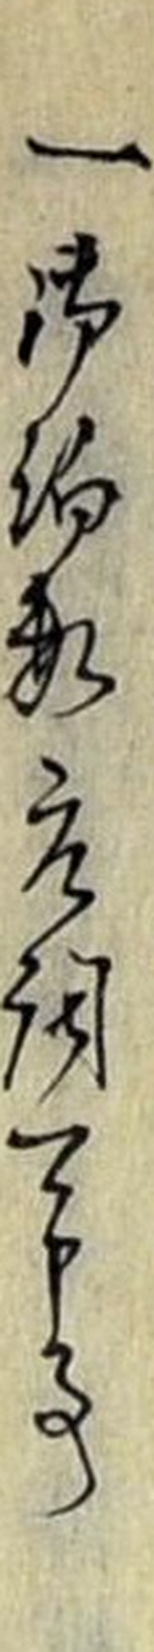一御泊数取調可申事
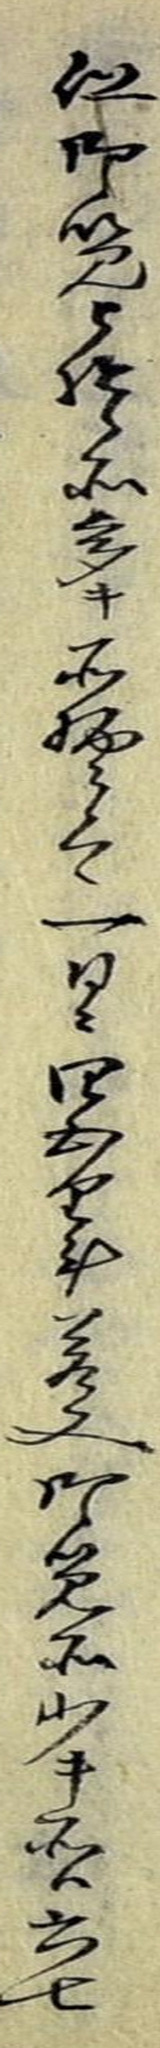但御覧被遊候所多キ所柄に候はヽ一日に四五里斗若又御覧所少キ所は六七
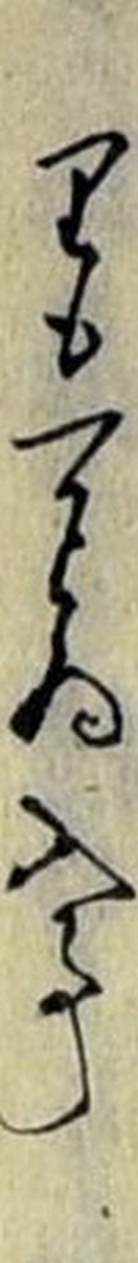里も可被為入事
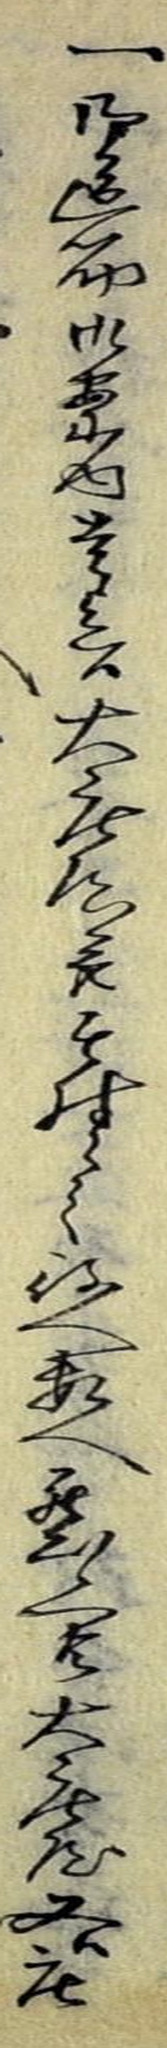一御道筋御案内是迄は大庄屋并其村々之役人数人罷出候へ共大庄屋又は庄
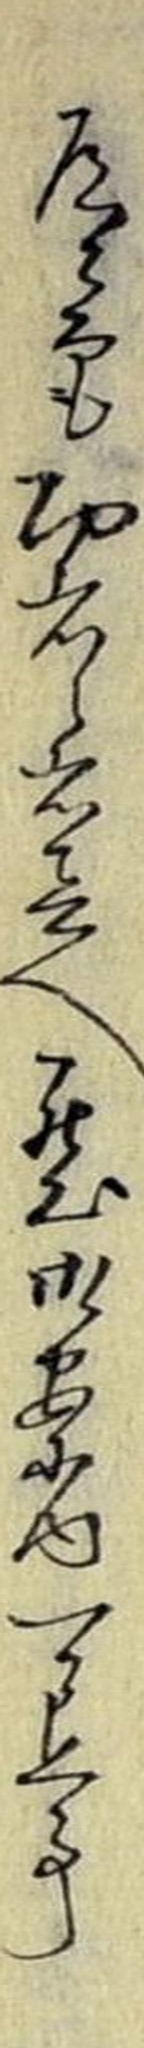屋に而も切者之者壱人罷出御案内可申上事
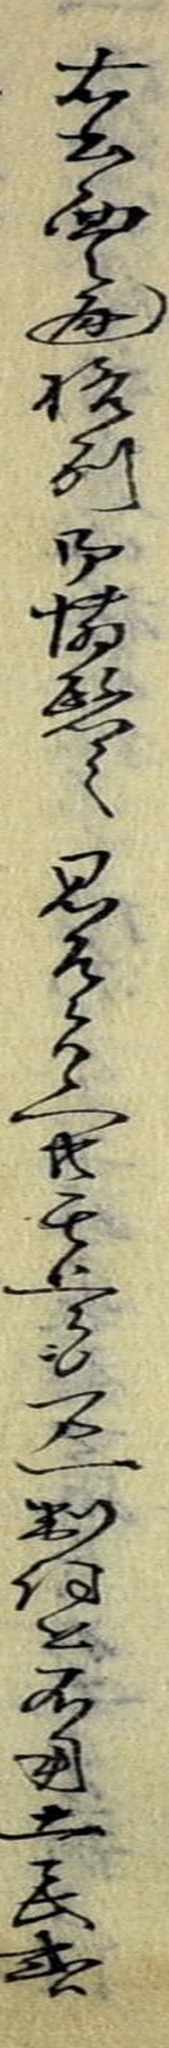右書面之通格別御憐愍之思召に候へ共其上にも万一判伺を不用土民或は
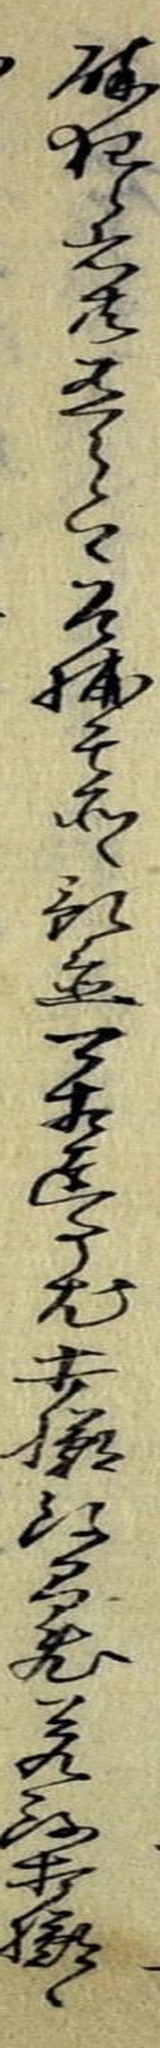餘犯之者共有之候はヽ召捕其所へ預置可相達事尤打擲致間敷若致打擲候
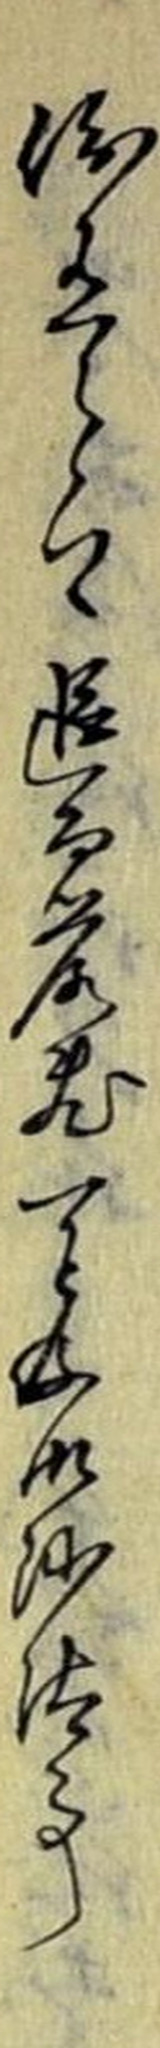儀有之候はヽ追而厳敷可被及御沙汰事
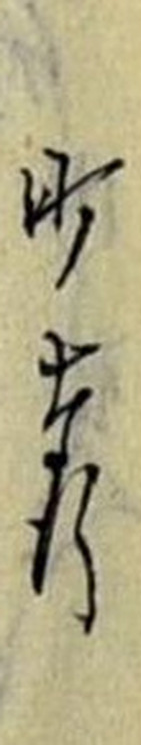町奉行
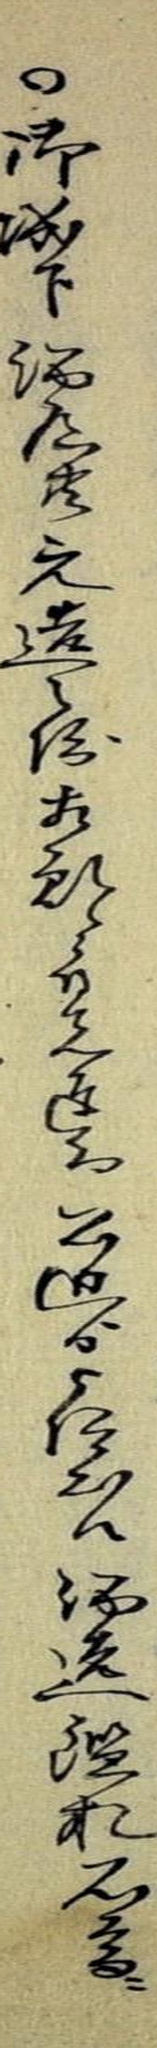○御城下酒屋共元造之儀相願候に付先達而公辺ゟ被仰出候酒造鑑札石高に
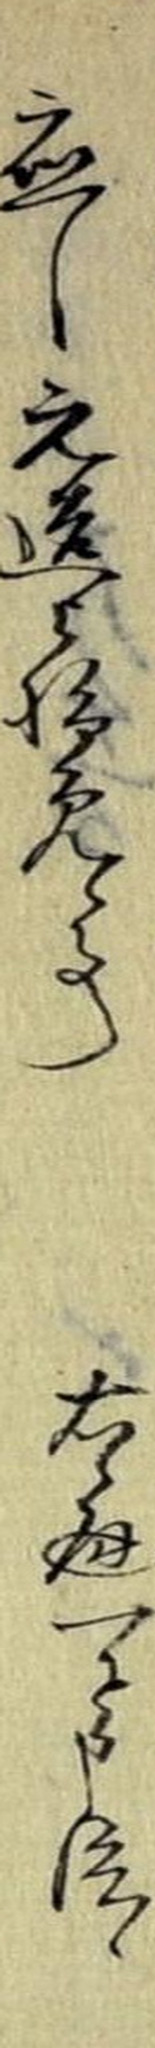応し元造被指免候事右之通可被申渡候
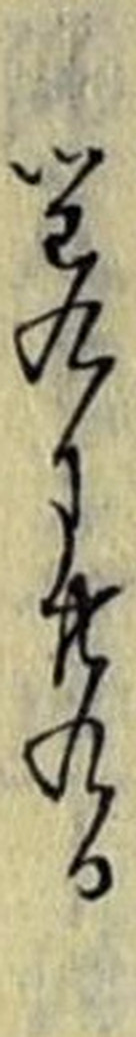閏九月廿九日
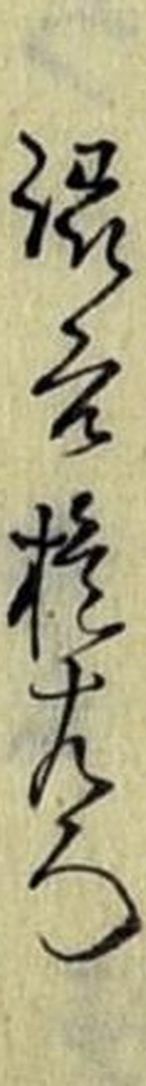渋谷権左衛門
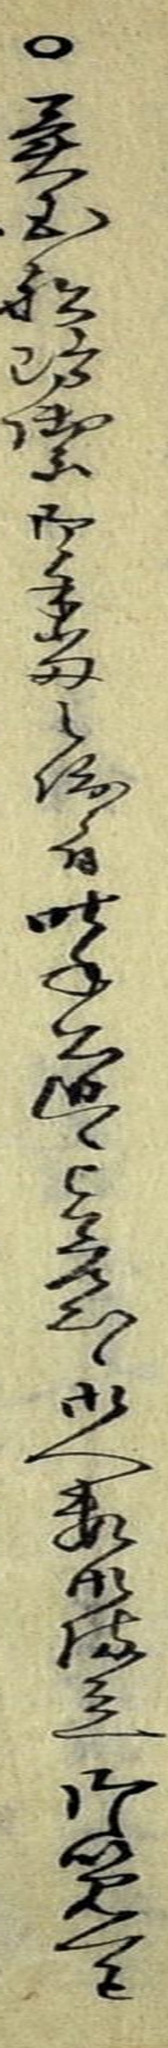○異国船防禦御手当之儀に付昨年公辺へ被差出候御人数御備立御覧可被
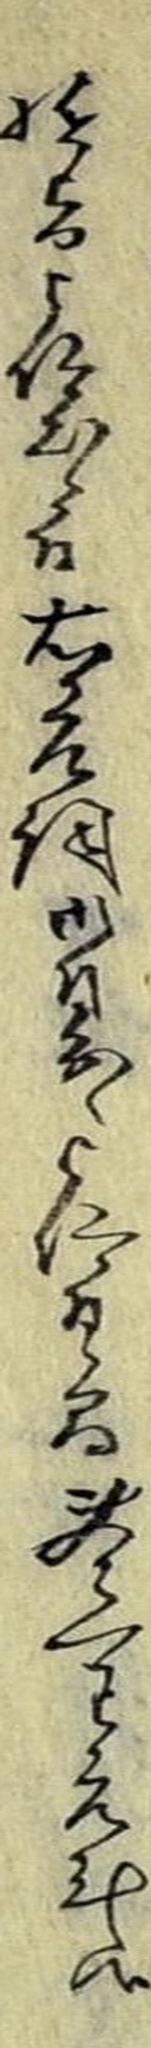遊候旨被仰出候に付右取調御自分へ被仰付候間夫々可被取斗候
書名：命令之部 六
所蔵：福井県文書館 Fukui Prefectural Archives
